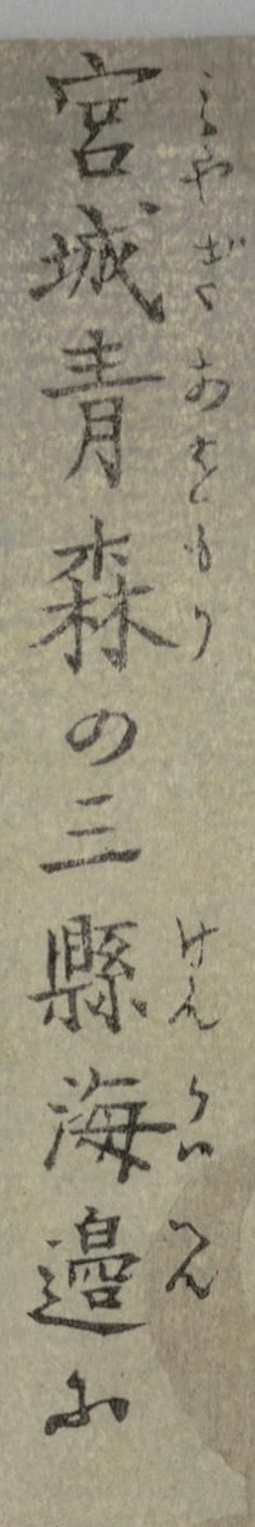宮城青森の三縣海邊に
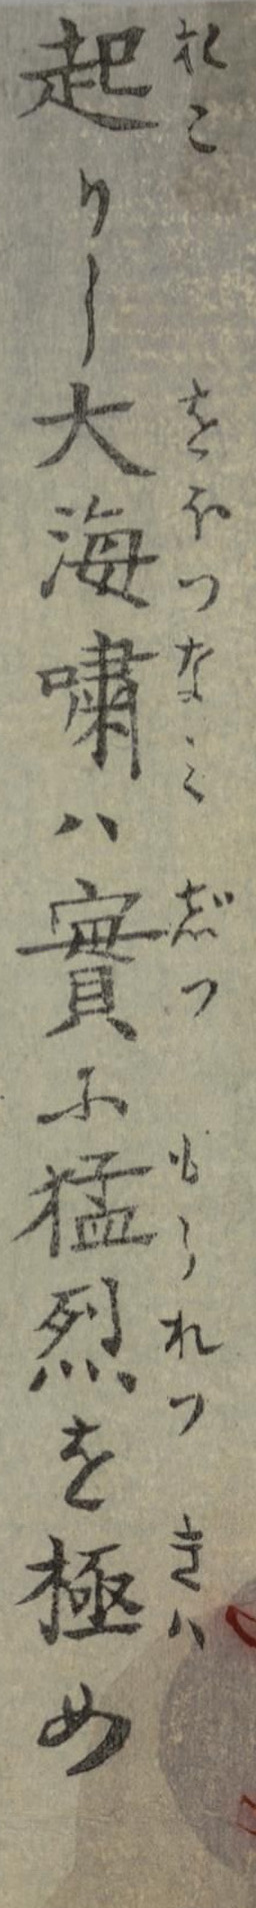起りし大海嘯は實に猛烈を極め
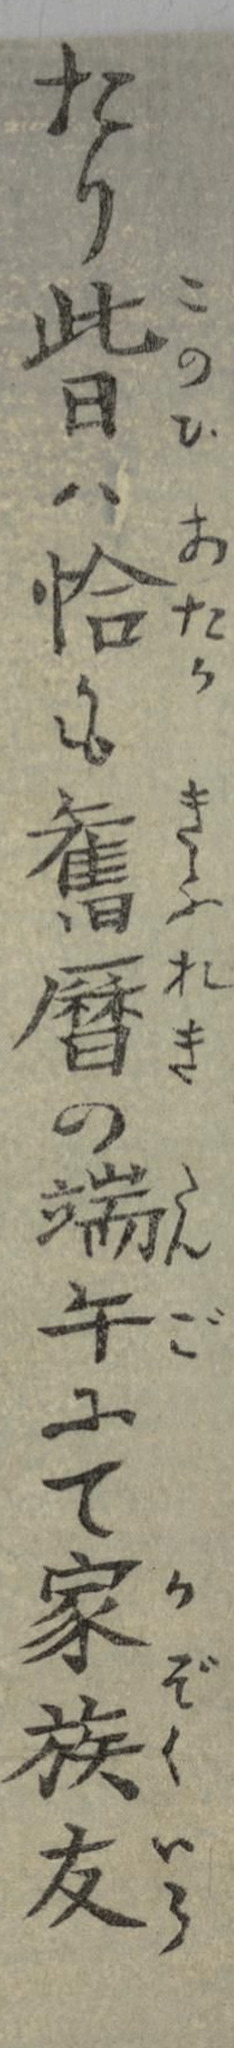たり此日は恰も舊暦の端午にて家族友
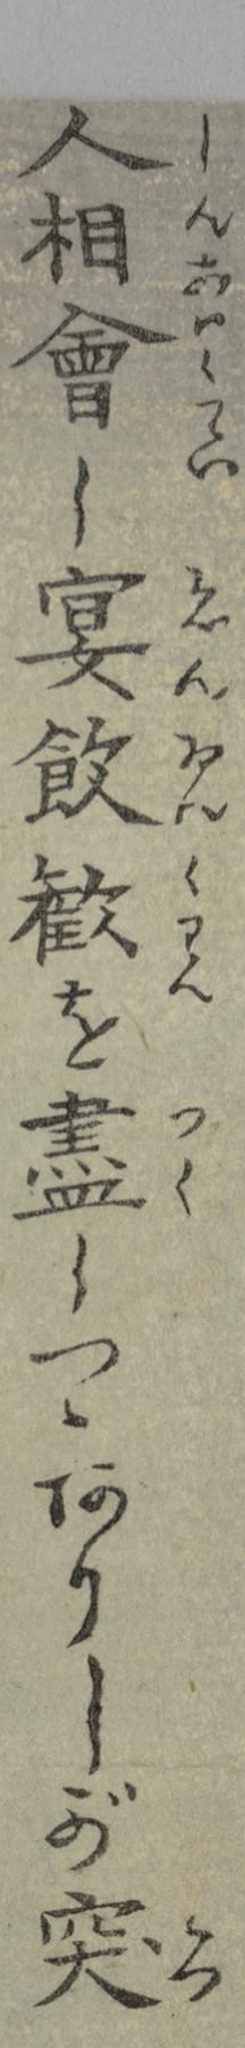人相會し宴飲歓を盡しつゝありしが突
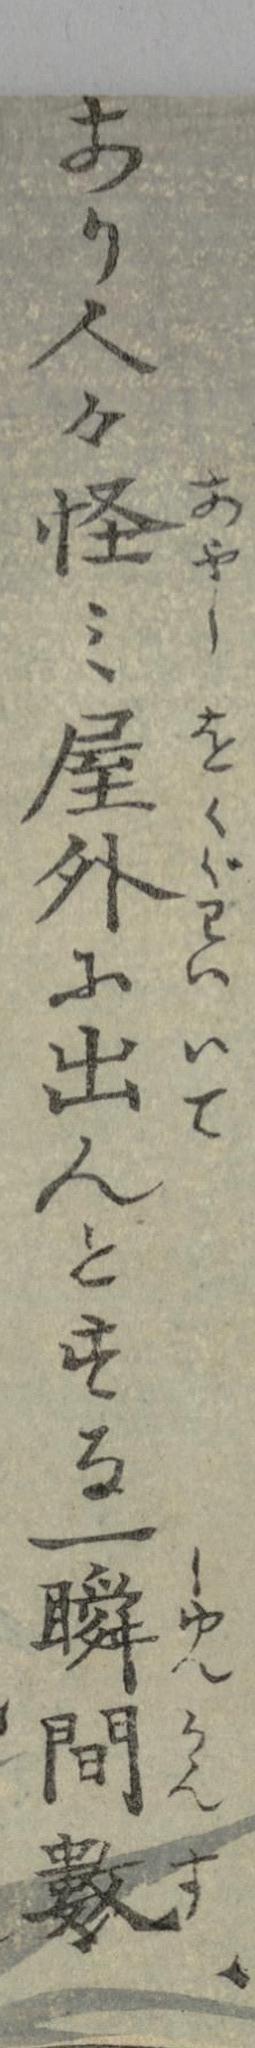あり人々怪み屋外に出んとする一瞬間數
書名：明治丙申　三陸大海嘯之實況
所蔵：東京大学地震研究所図書室 Earthquake Research Institute Library, The University of Tokyo, JAPAN
